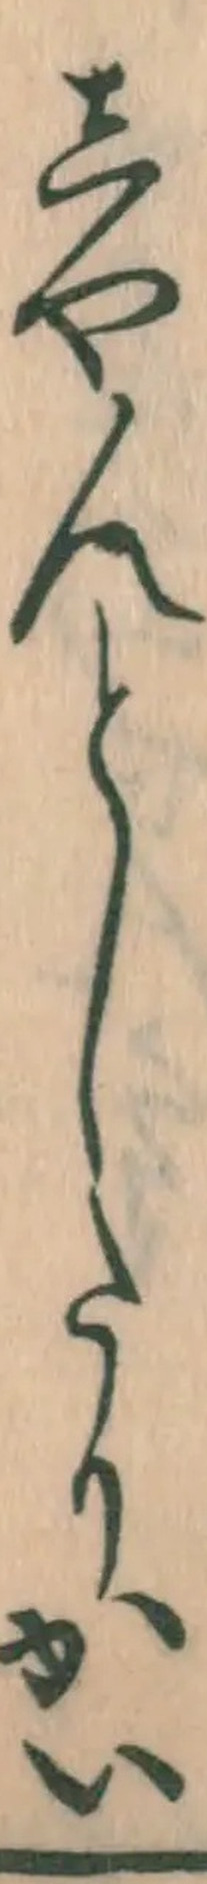しやんとしたりかい
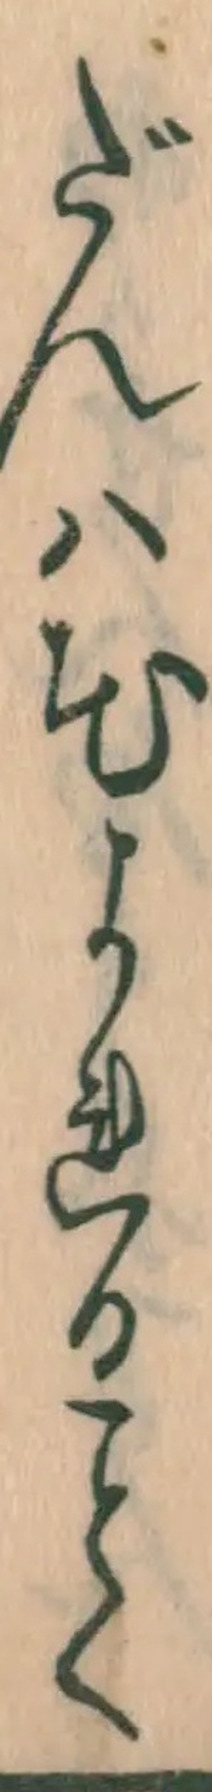だんは花よれることく
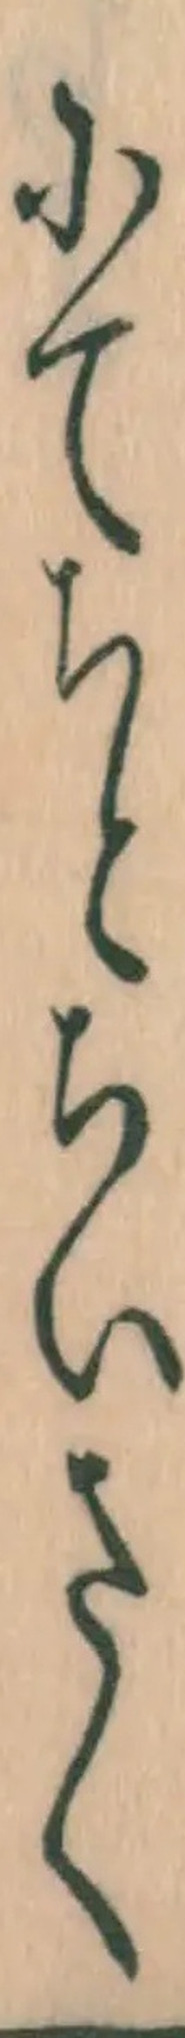にてちとちいさく
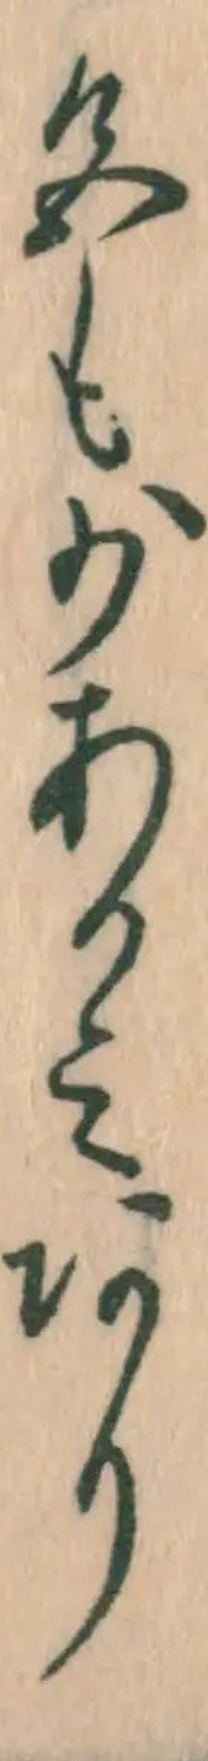色も少あかみなり
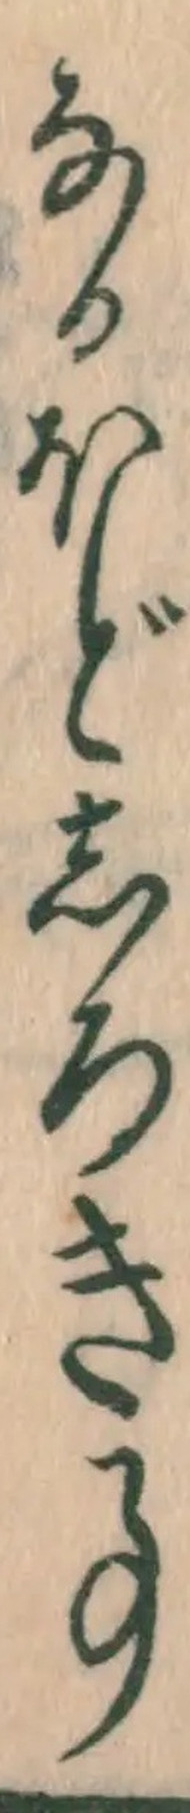なるほどしろき事
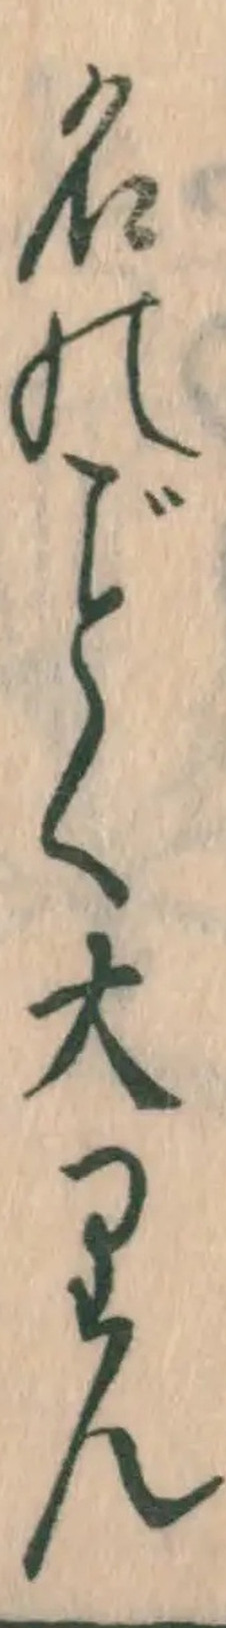名のごとく大りん
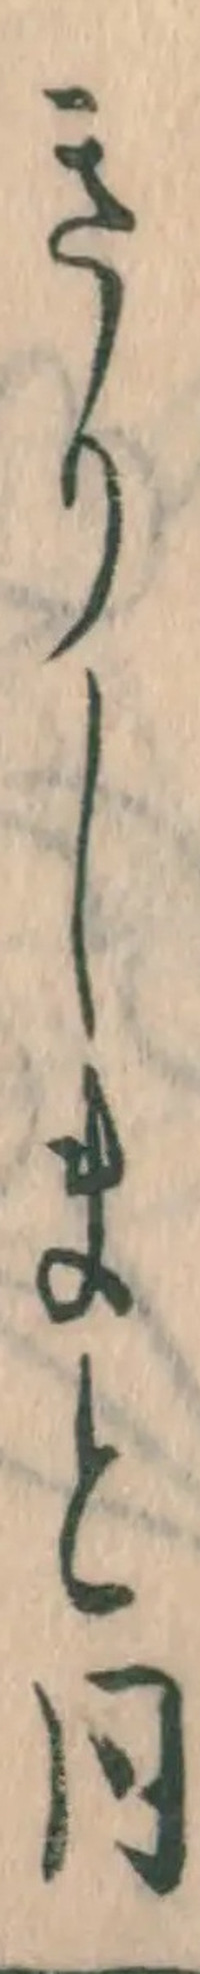きりしまと同
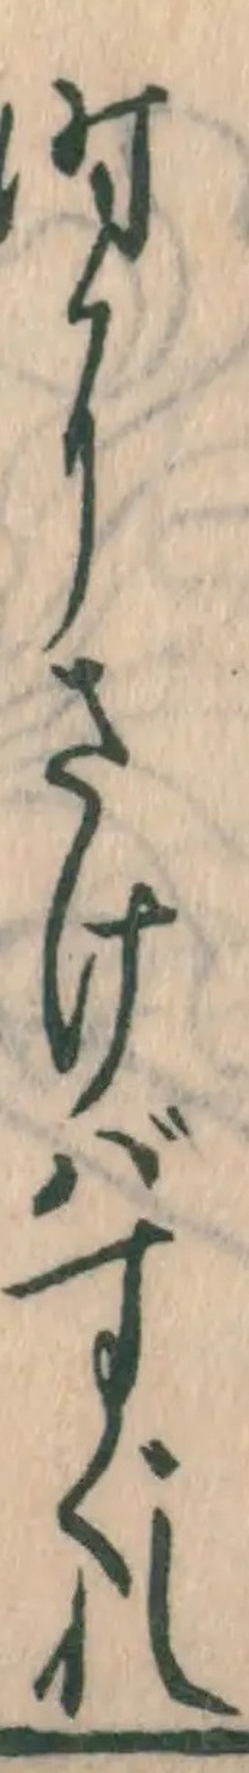時にさけばすぐれ
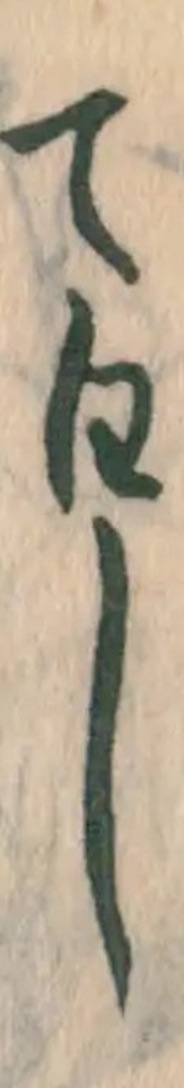て白し

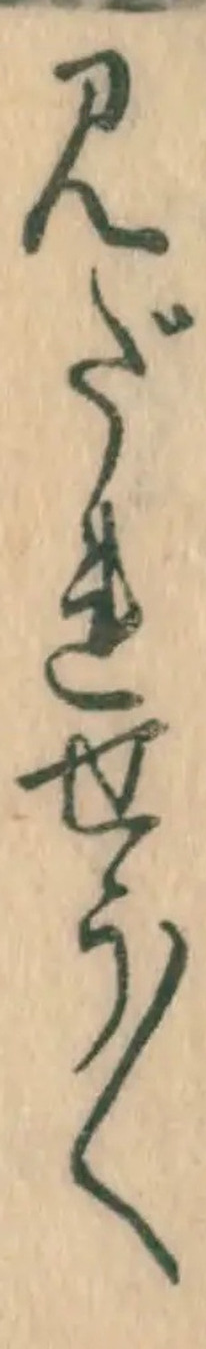▲みだれせう〳〵
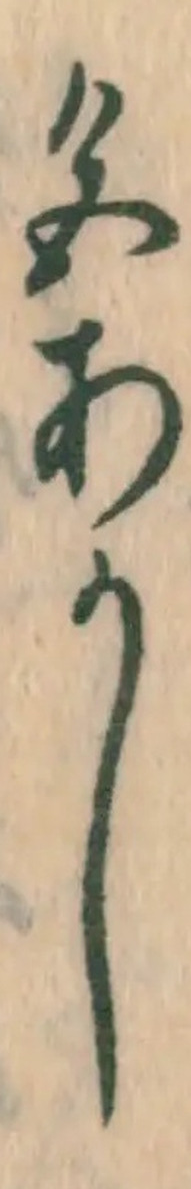色あかし
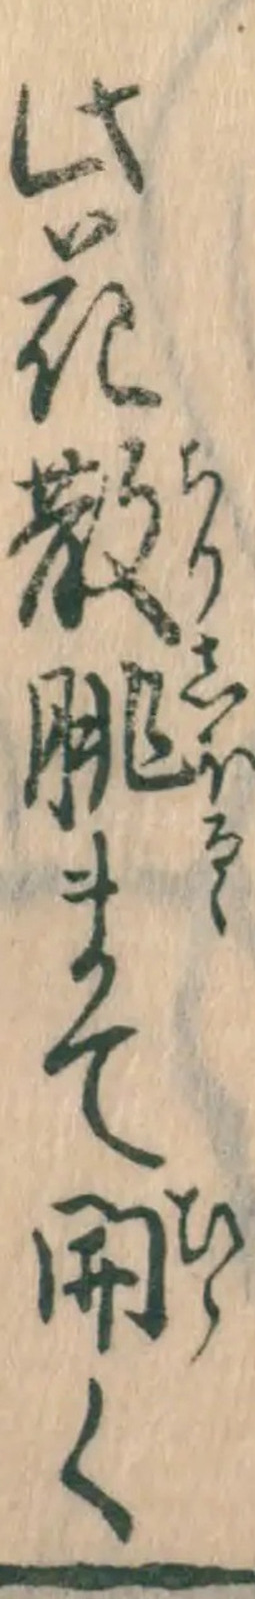此花散朓まて開く
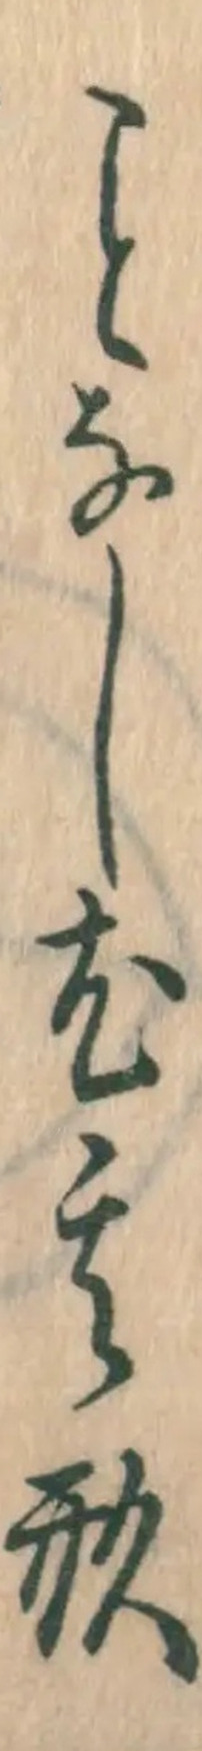ことなし尤其形
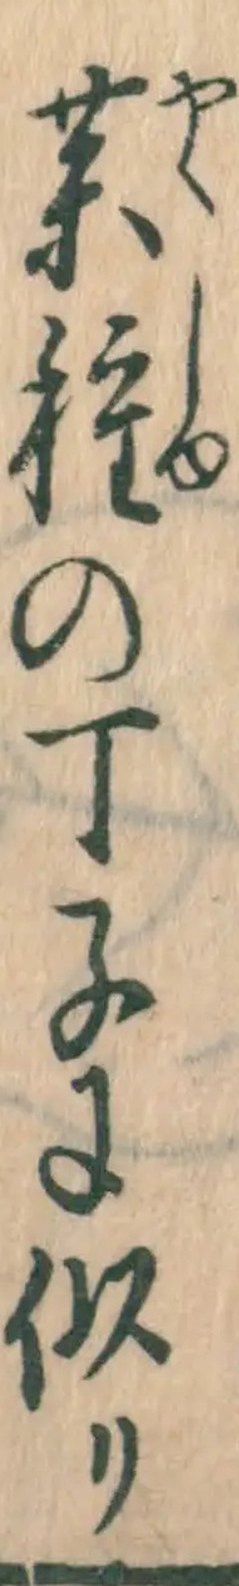薬種の丁子に似り
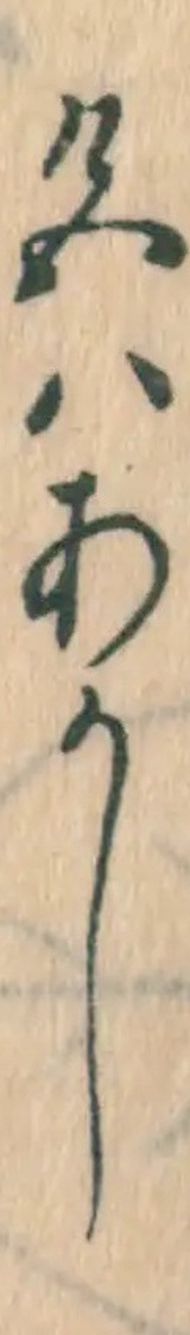色はあかし

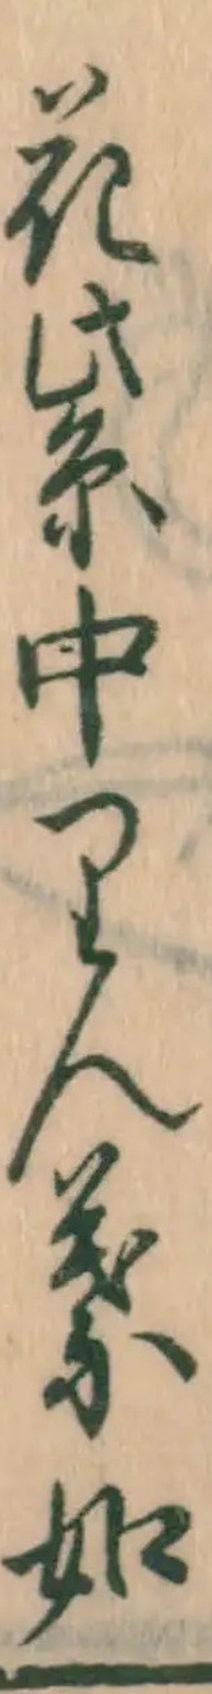花紫中りん葉如
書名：錦繍枕 5巻. [2]
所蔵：国立国会図書館 National Diet Library, JAPAN
